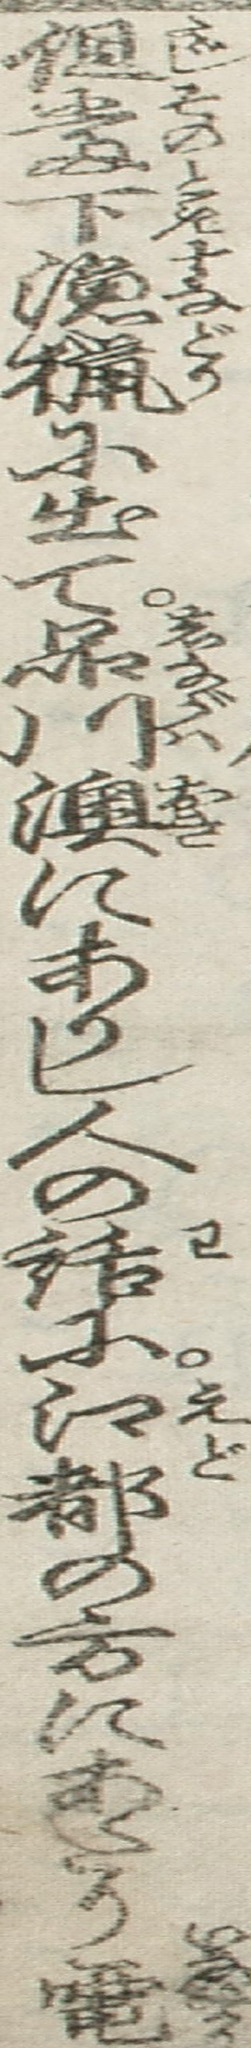但当下漁猟に出て。品川澳にありし人の話に。江都の方にあたり電

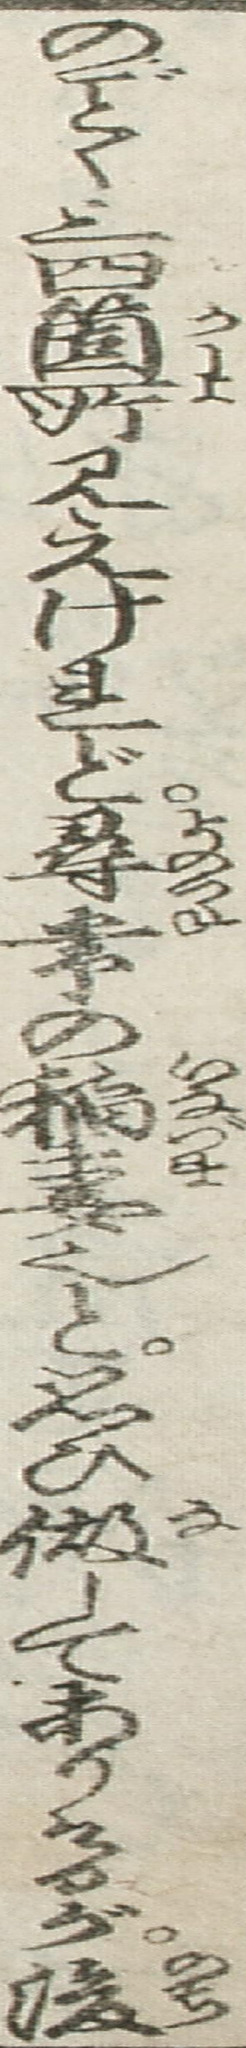のごとく三四箇所見えけれど。尋常の稲妻也と。思ひ做してありけるが。後
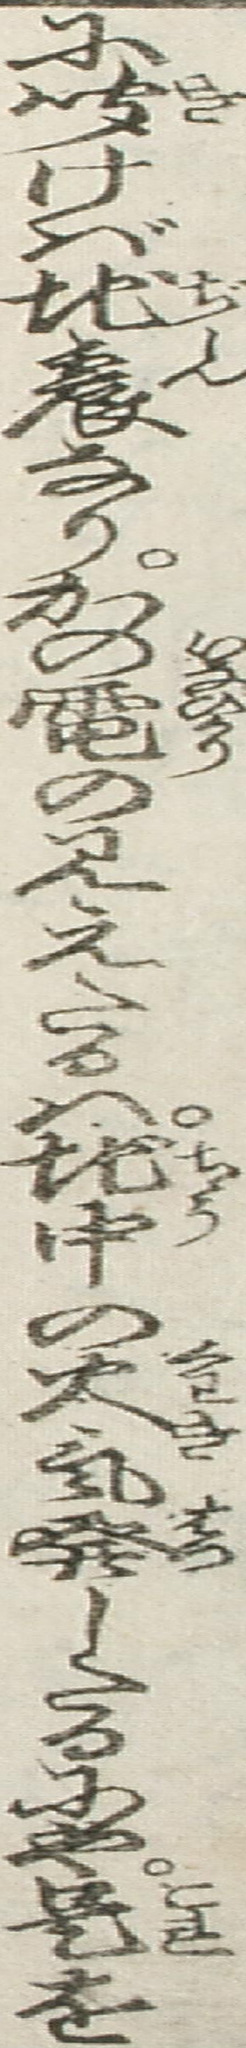に聞けば地震なり。かの電の見えたるは。地中の火気発したるにや。是を
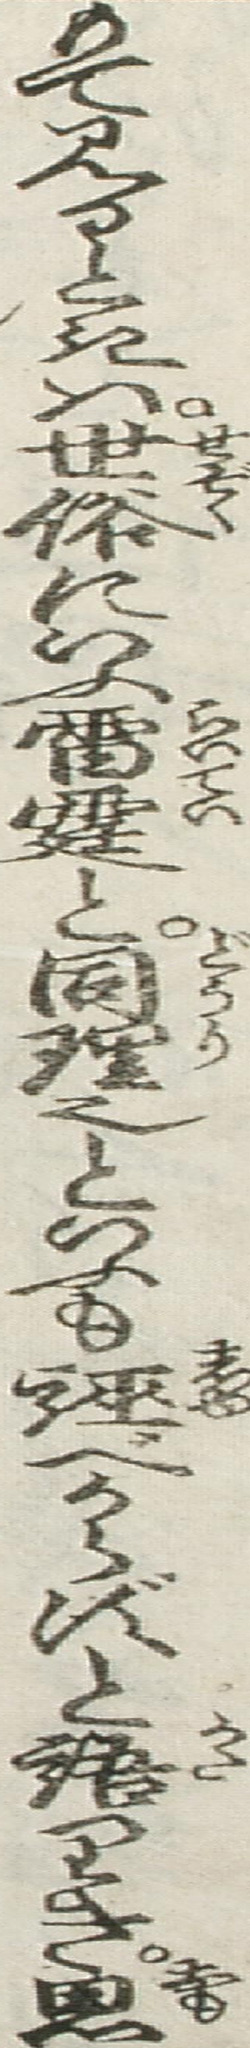もて見るときは。世俗にいふ雷霆と。同理也といふも誣べからずと語りき。思
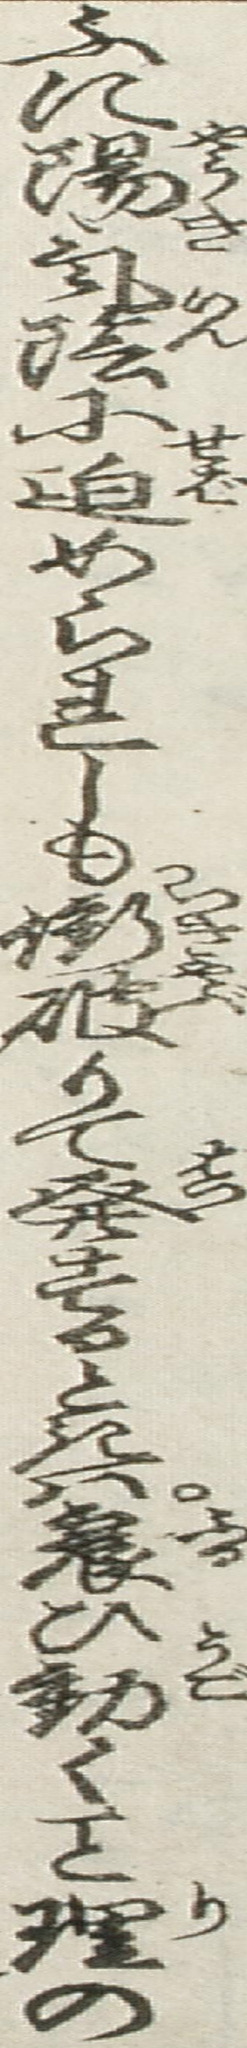ふに陽気陰に迫められしも。衝破りて発するときは。震ひ動くこと理の
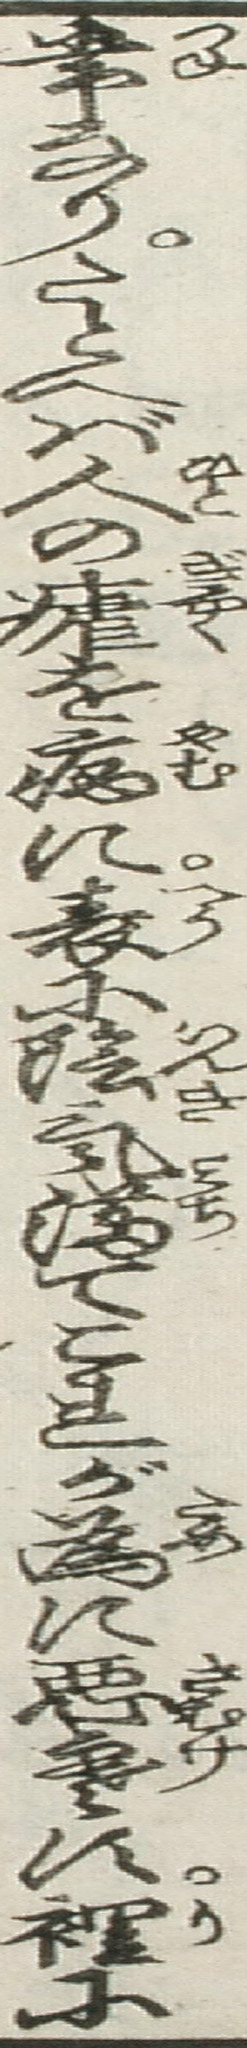常なり。たとへば人の瘧を病に。表に陰気満てこれが為に悪寒す。裡に
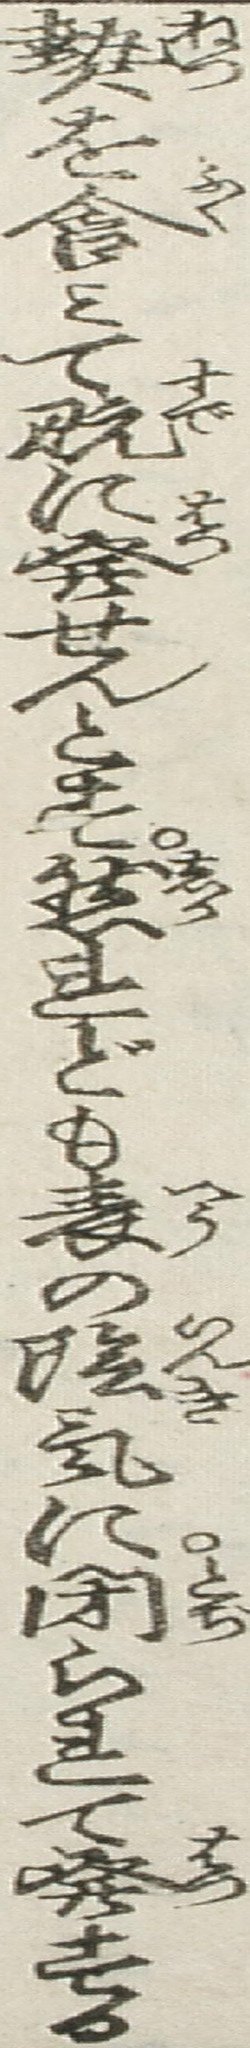熱を含みて既に発せんとす。然れども表の陰気に閉られて発する
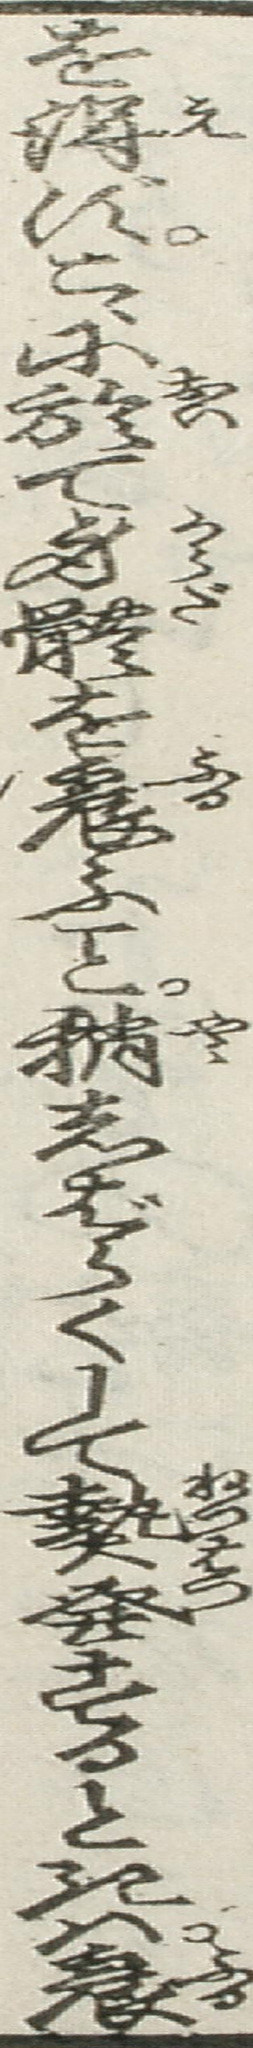を得ず。こゝに於て身體を震ふこと。稍しばらくして熱発するときは。震
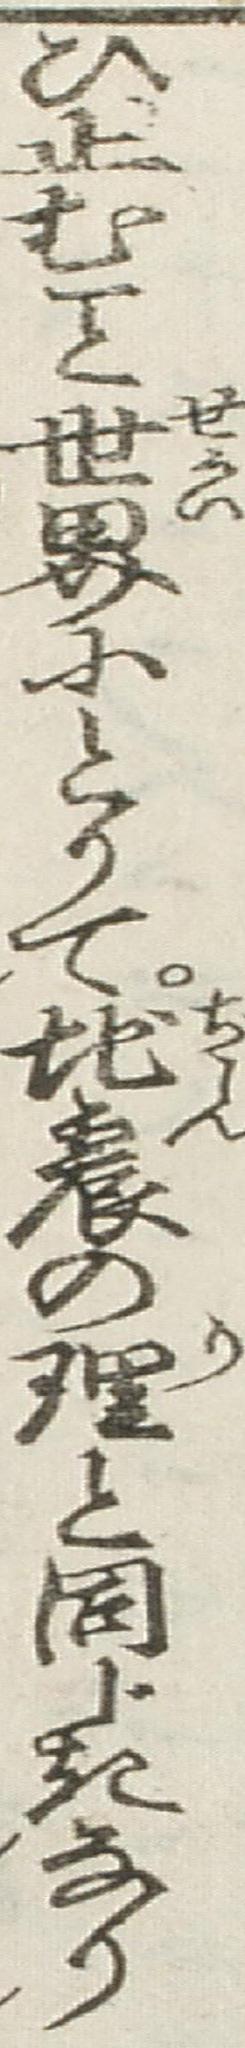ひ止むこと世界にとりて。地震の理と同じきなり
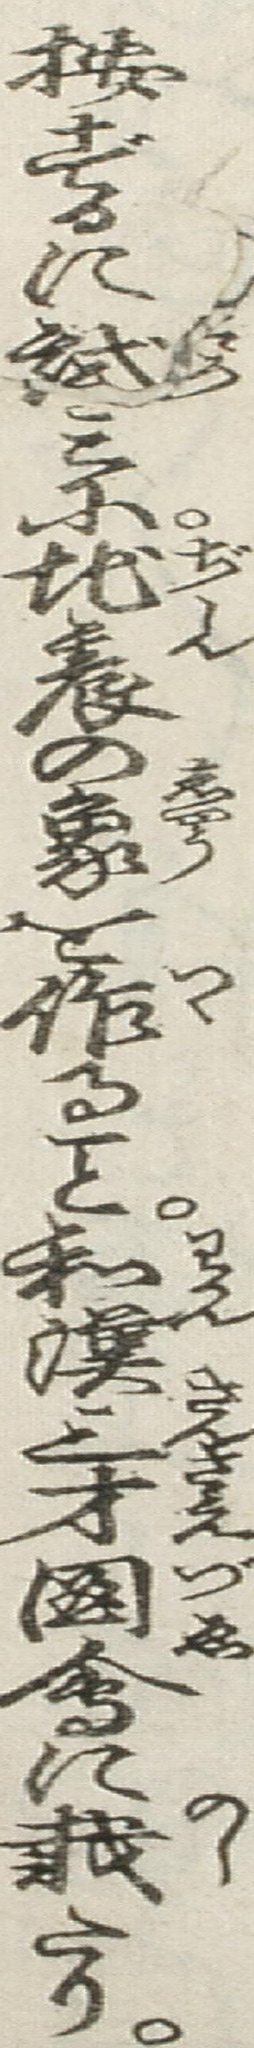按ずるに試みに地震の象を作ること。和漢三才図会の載たり。
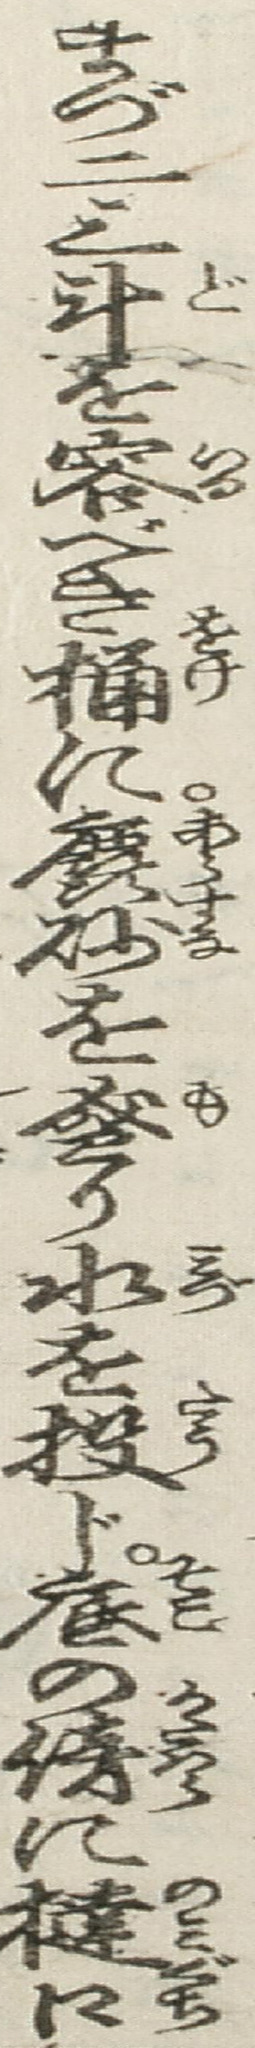まづ二三斗を容べき桶に麁砂を盛り水を投じ。底の傍に撻口
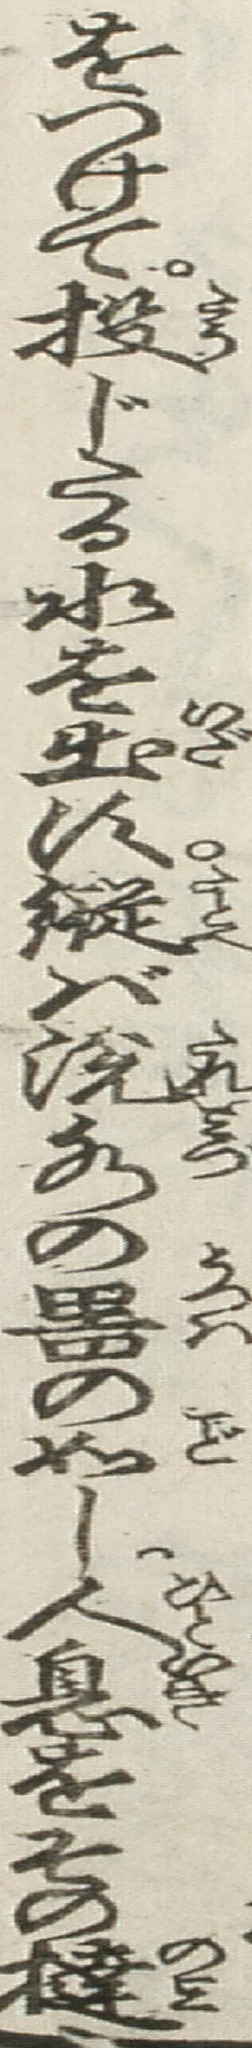をつけて。投じたる水を出す。縦ば涗水の器の如し。人息をその撻
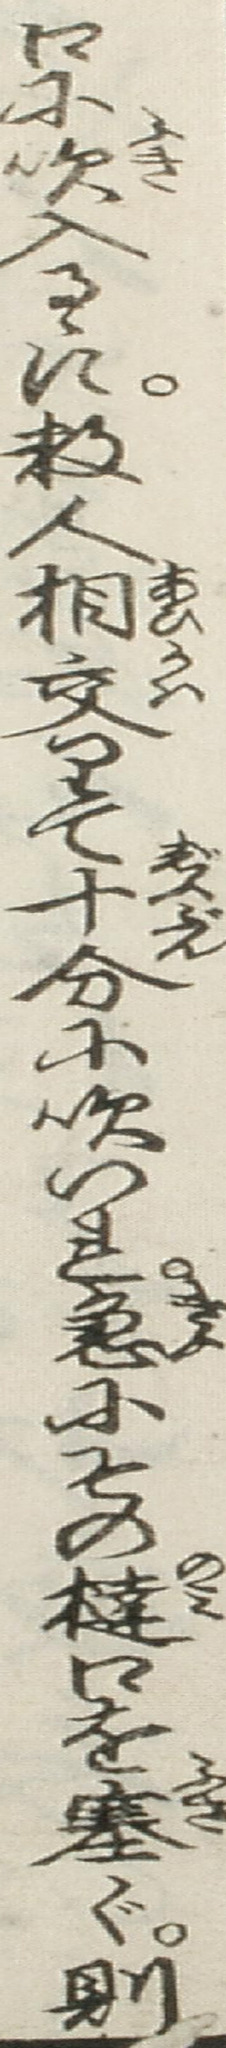口に吹入るゝに。数人相交りて十分に吹いれ。急にその撻口を塞ぐ。則
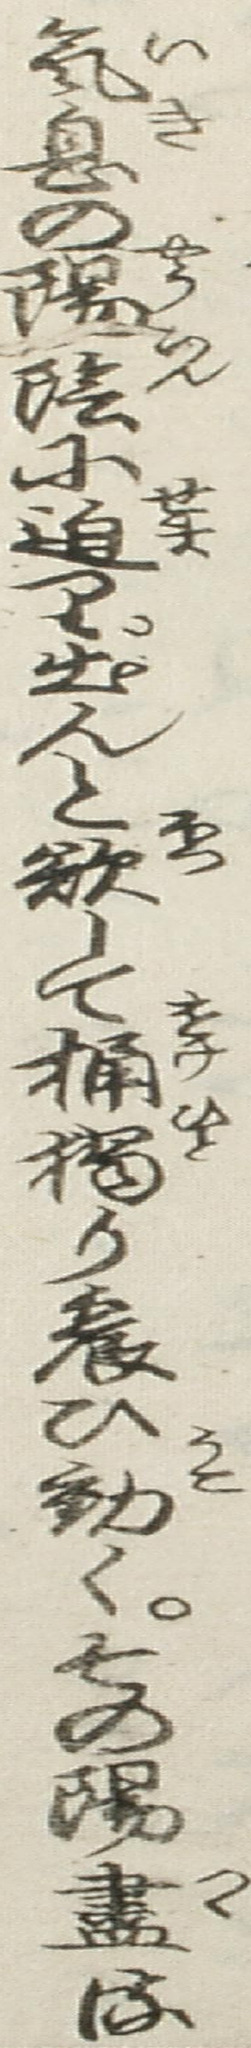気息の陽陰に迫り。出んと欲して桶独り震ひ動く。その陽盡る
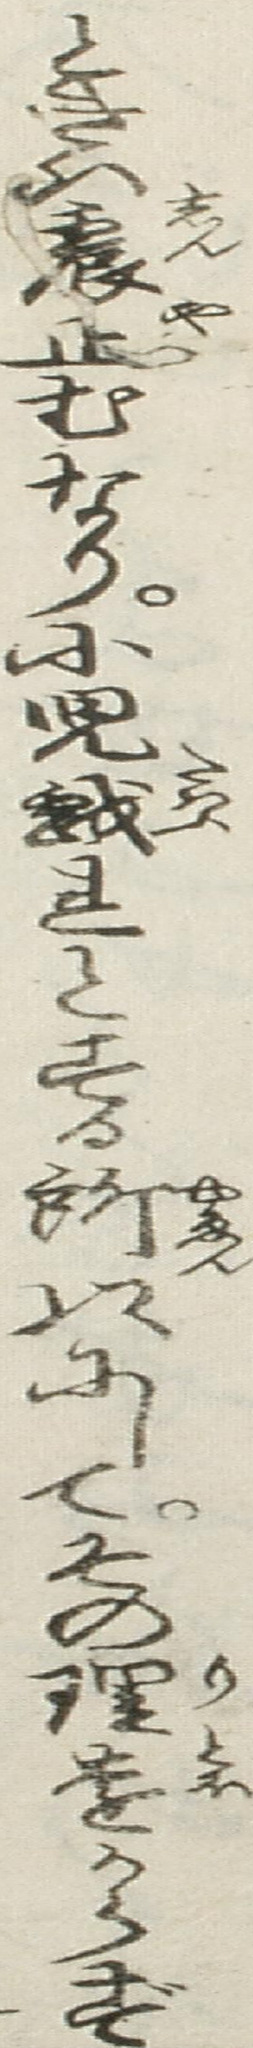ときは震止むなり。小児戯れとする所以にして。その理遠からず
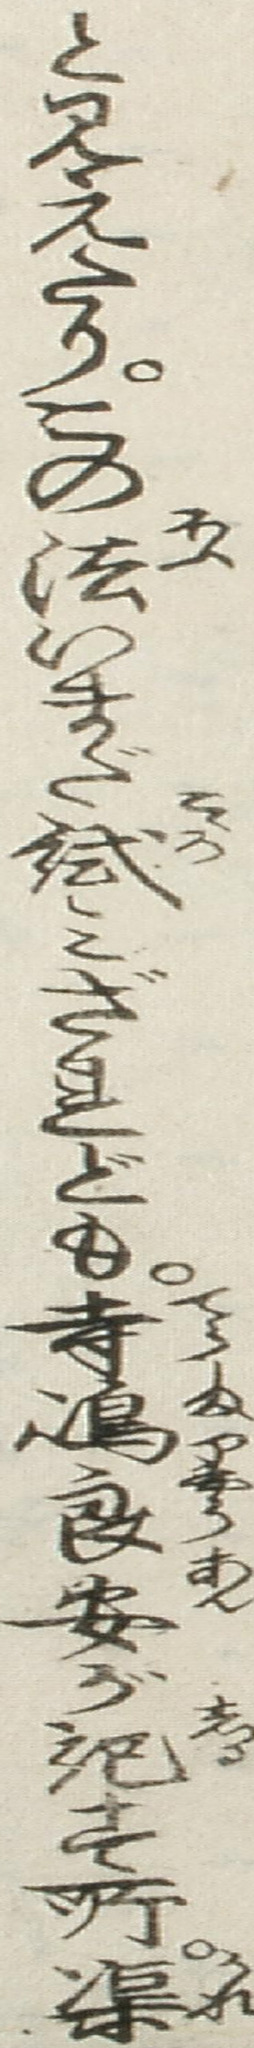と見えたり。この法いまだ試みざれども。寺嶋良安が記す所。渠
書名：安政見聞録　下
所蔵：東京大学地震研究所図書室 Earthquake Research Institute Library, The University of Tokyo, JAPAN
